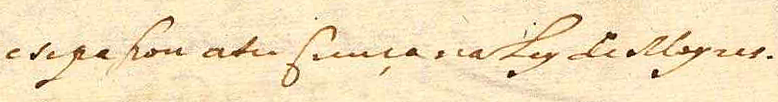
e se passou a ter Crença na Ley de Moyzes.
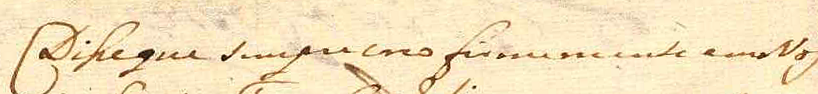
Disse que sempre creo firmemente em Nos
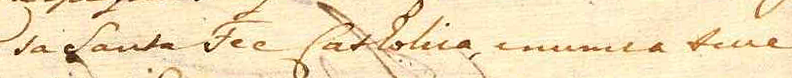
sa Santa Fee Catholica, e numca teue
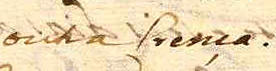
outra Crença.
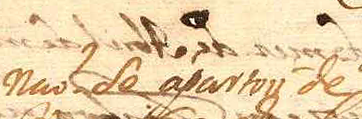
naõ se apartou de
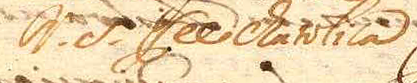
N. S. fee chatolica
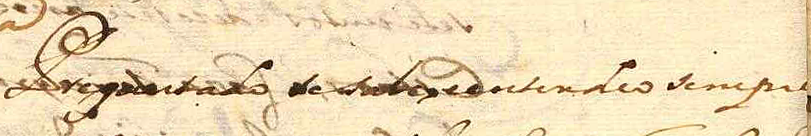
Preguntado se sabe, e entendeo sempre
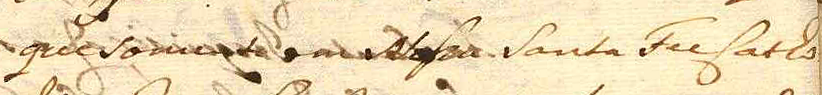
que somente em Nossa Santa Fee Catho
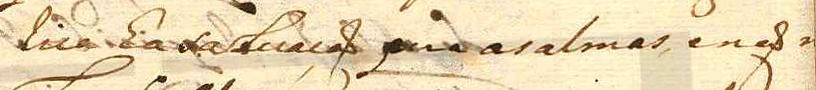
lica ha saluaçaõ pera as almas, e naõ n
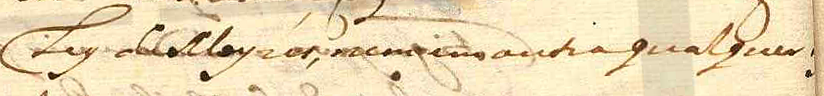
Ley de Moyzes, nem em outra qualquer
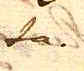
ta.
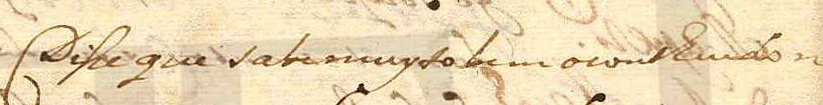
Disse que sabe muyto bem o contheudo n
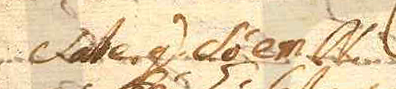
sabe q̄ só em N.
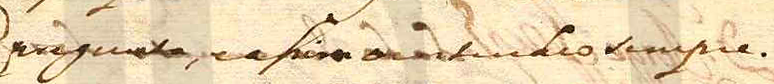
pregunta, e assim o entendeo sempre.
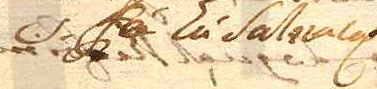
S. feé há Saluaçaõ
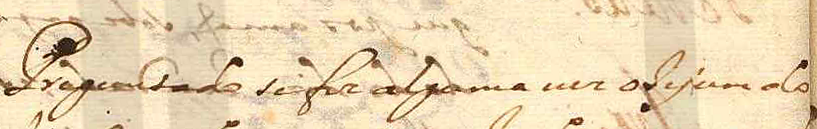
Preguntado se fez alguma uez o Iejum do
